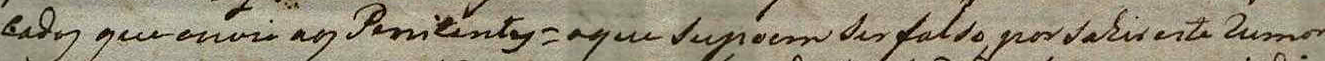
cados que ouvia aos Penitentes = o que supoem ser falso, por sahir este Rumor
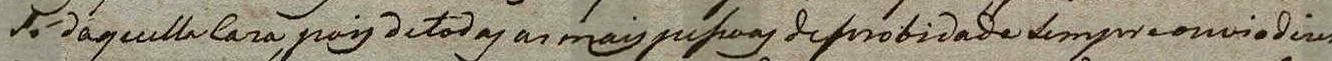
só daquella Caza, pois de todas as mais pessoas de probidade sempre ouvio dizer
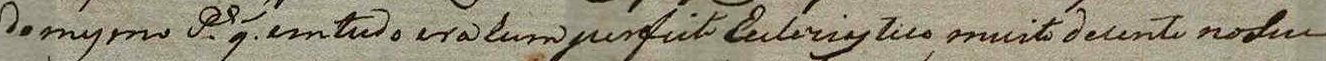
do mesmo P.e q̄ em tudo era hum perfeito Eccleziastico, muito decente no seu
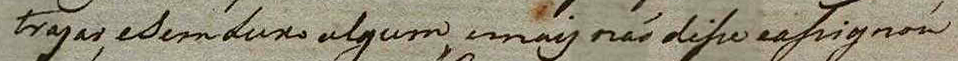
trajar, e sem Luxo algum, e mais naõ disse e assignou
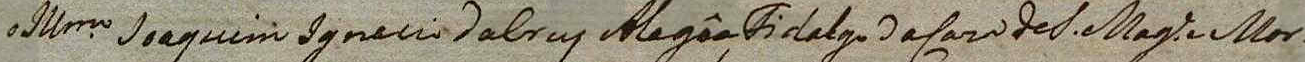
o Ill.mo Ioaquim Ignacio da Crus Alagôa, Fidalgo da Caza de S. mag.e e Mor
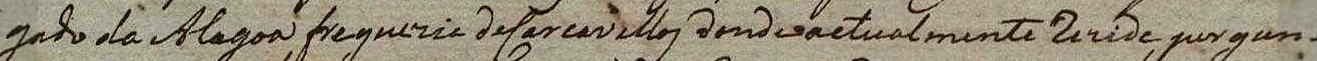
gado da Alagoa, freguezia de Carcavellos donde actualmente Rezide, pergun
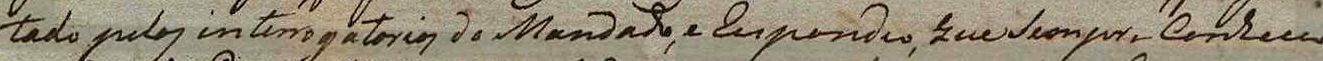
tado pelos interrogatorios do Mandado, e Respondeo, Que sempre Conheceo
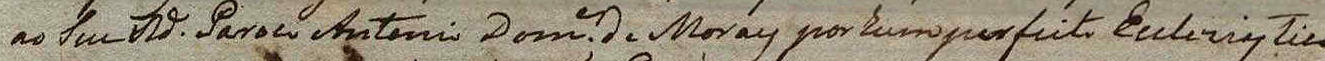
ao seu Rd.o Paroco Antonio Dom.es de Moraes por hum perfeito Eccleziastico
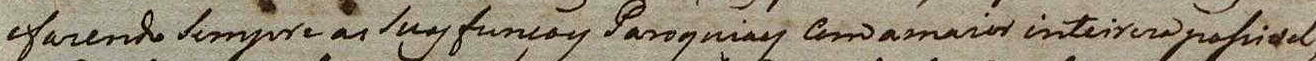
e fazendo sempre as suas funções Paroquiaes com a maior inteireza possivel,
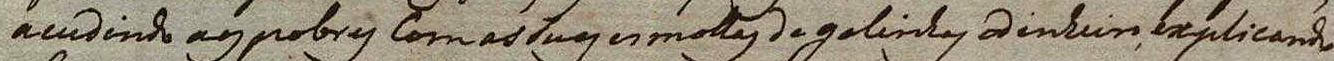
acudindo aos pobres Com as suas esmollas de galinhas e dinheiro, explicando
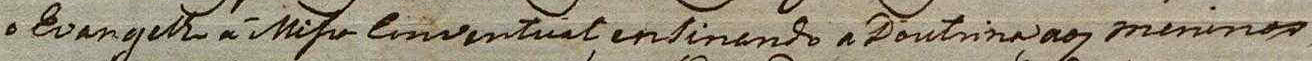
o Evangelho á Missa Conventual ensinando a Doutrina aos meninos,
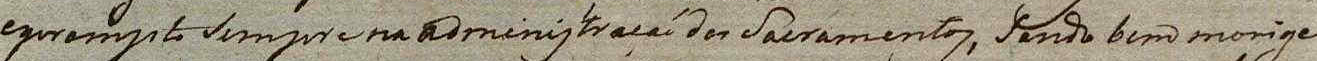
e prompto sempre na administraçaõ dos Sacramentos, sendo bem morige
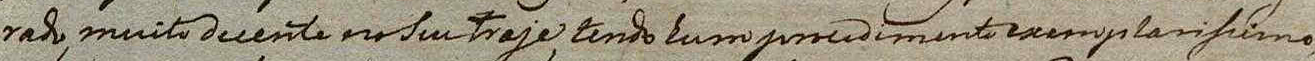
rado, muito decente no seu traje, tendo hum procedimento exemplarissimo,
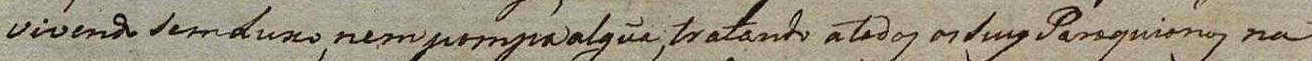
vivendo sem Luxo, nem pompa algūa, tratando a todos os seus Paroquianos na
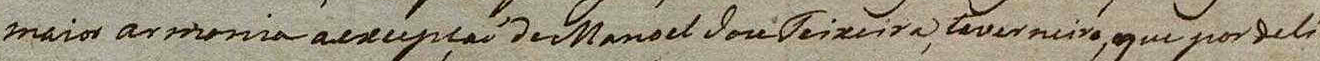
maior armonia a excepçaõ de Manoel Ioze Teixeira, taverneiro, que por deli
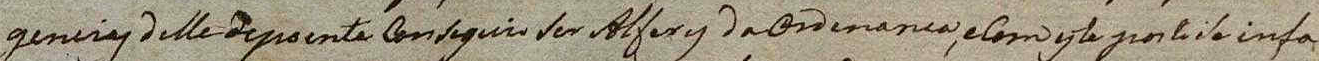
gencias delle depoente conseguio ser Alferes da Ordenança, e com este posto se infa
